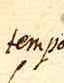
tempo
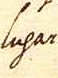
lugar
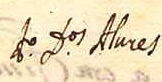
d̄.o D.os Alures
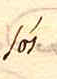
sós
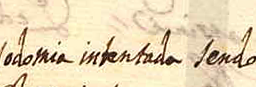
Sodomia intentada sendo
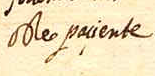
o Reo paçiente.
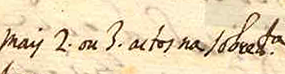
mais 2. ou 3. actos na sobred̄.a
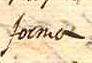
forma
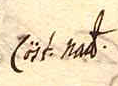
Cost. na d̄.
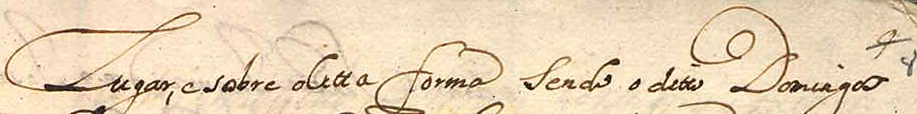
Lugar, e sobreditta forma Sendo o ditto Domingos
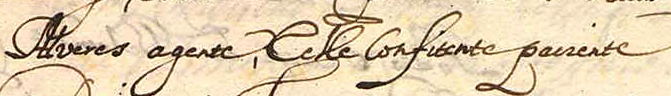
Alveres agente, E elle Confitente paciente
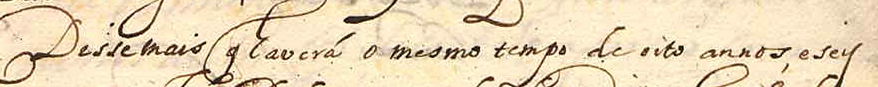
Disse mais q̄ haverá o mesmo tempo de oito annos e seis
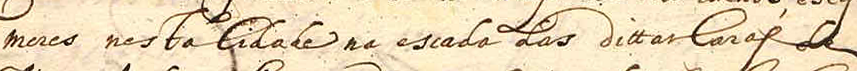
mezes nesta Cidade na escada das dittas Cazas de
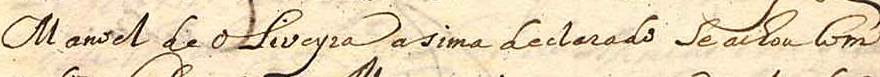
Manoel de oLiveyra asima declarado se achou com
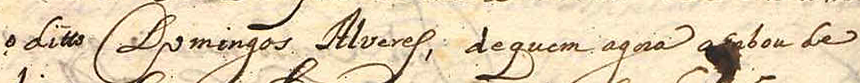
o ditto Domingos Alveres, de quem agora acabou de
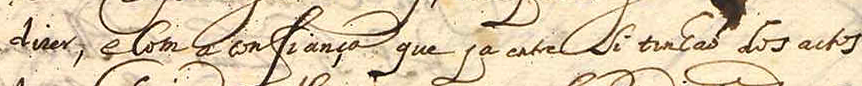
dizer, e Com a confiança que ja entre si tinhaõ dos actos
